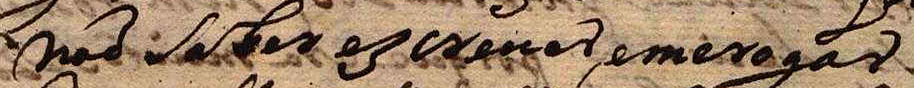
naõ saber ezcreuer, e me rogar
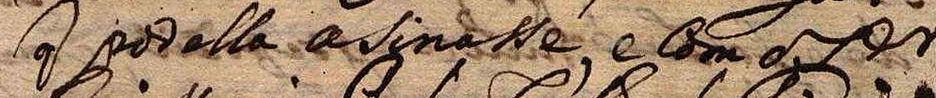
q̄ por ella asinasse, e com o Sor
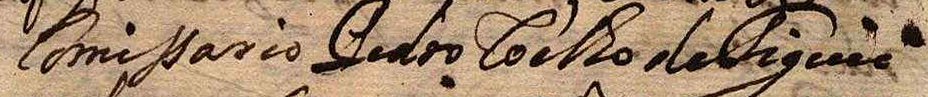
Comissario Pedro Coelho de Figuei
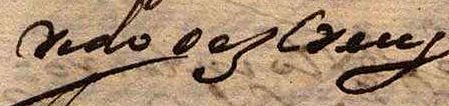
redo o ezcreuj
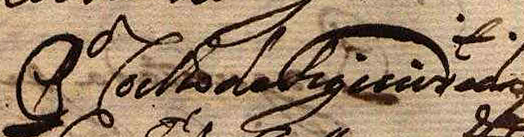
Po Coelho de Figueiredo
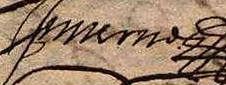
Jnuerno
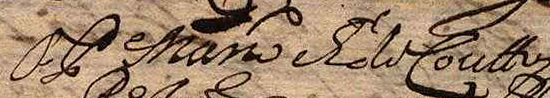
O Pe Manoel do Coutto
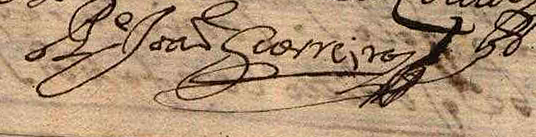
o Pe Joaõ Guerreiro
